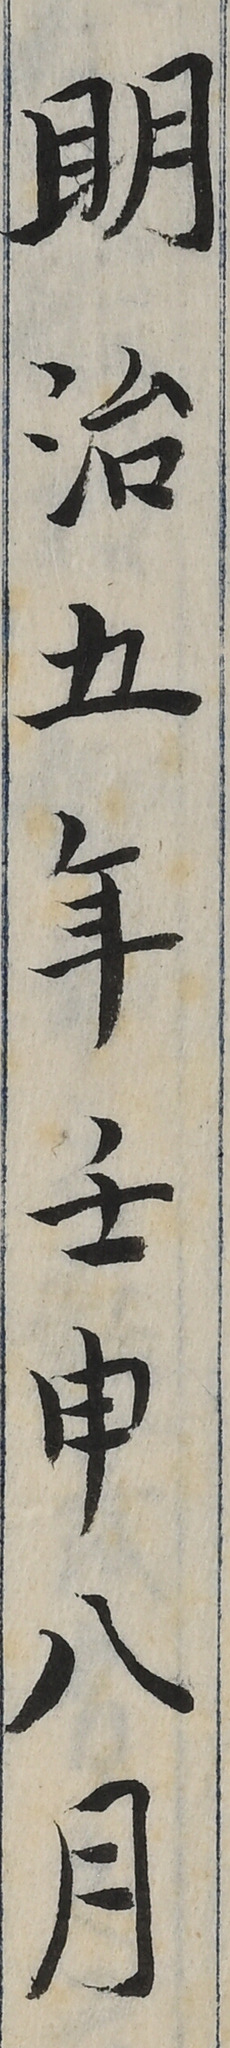明治五年壬申八月
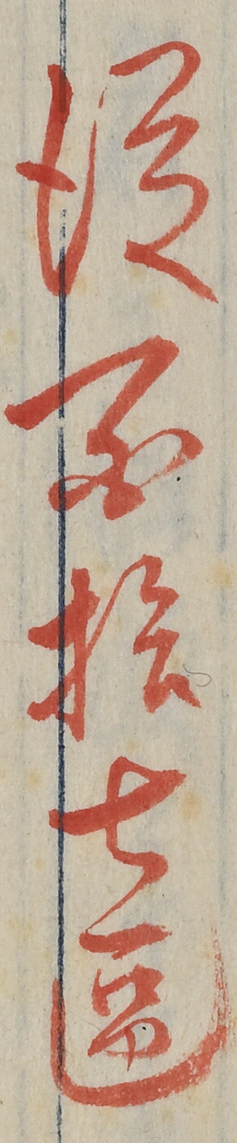従百拾七区

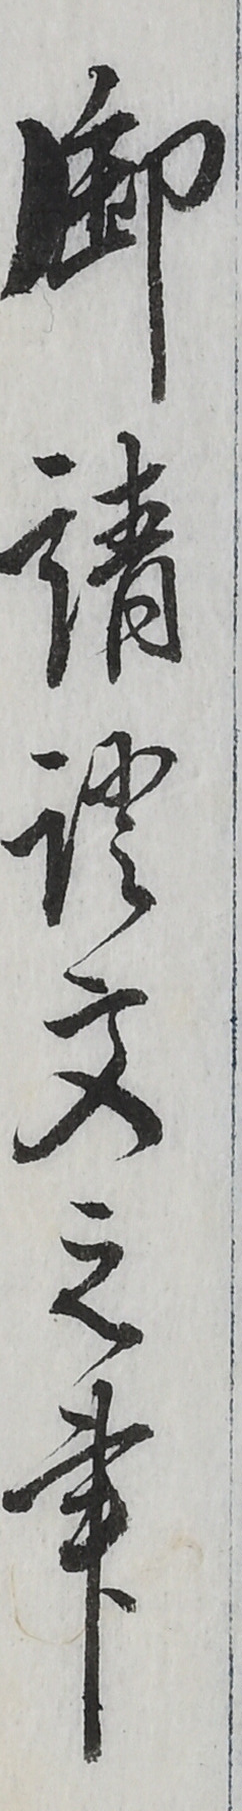御請証文之事
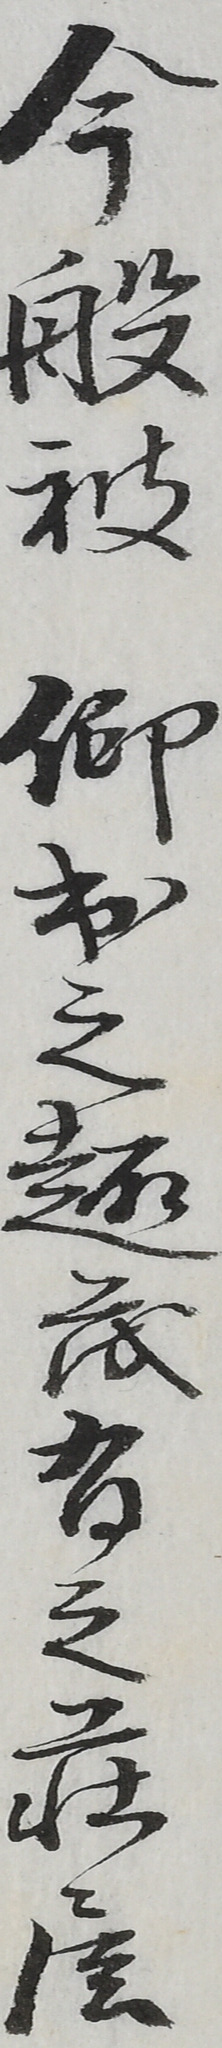今般被仰出之趣茂有之荘屋
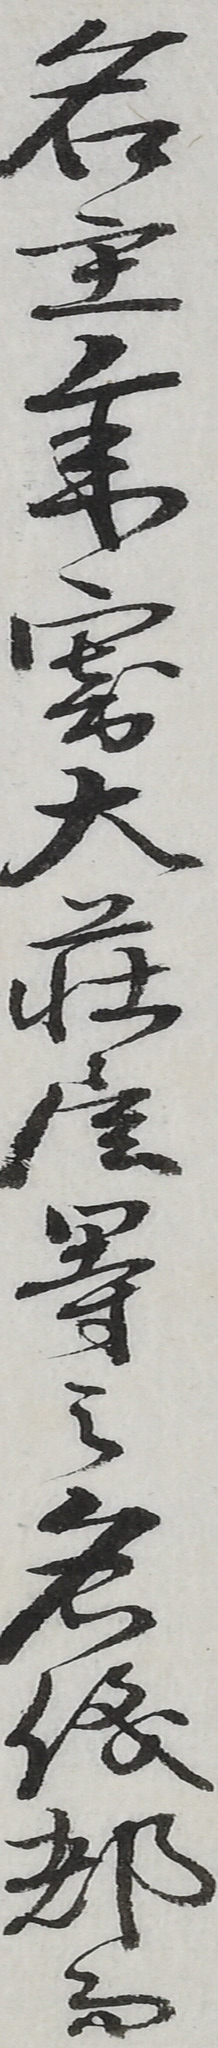名主年寄大荘屋等之名儀都而
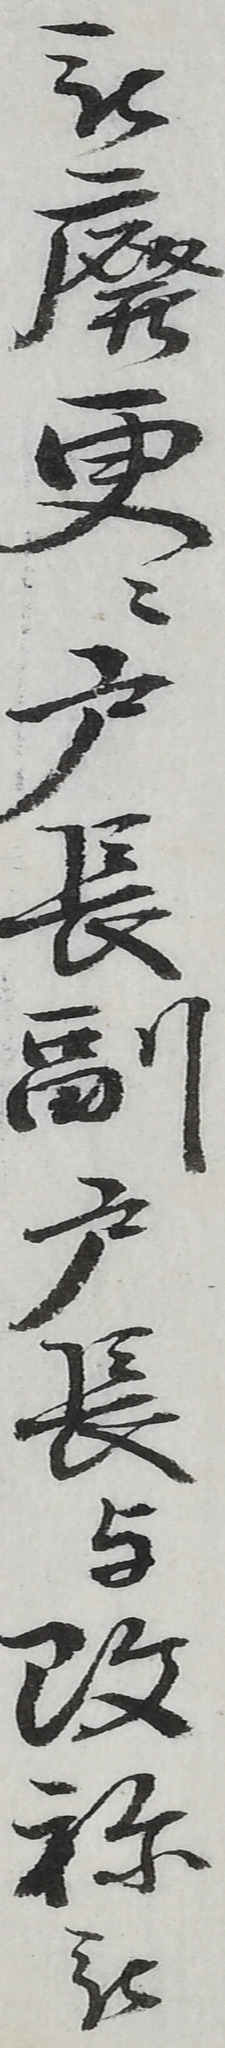被廃更ニ戸長副戸長と改称被
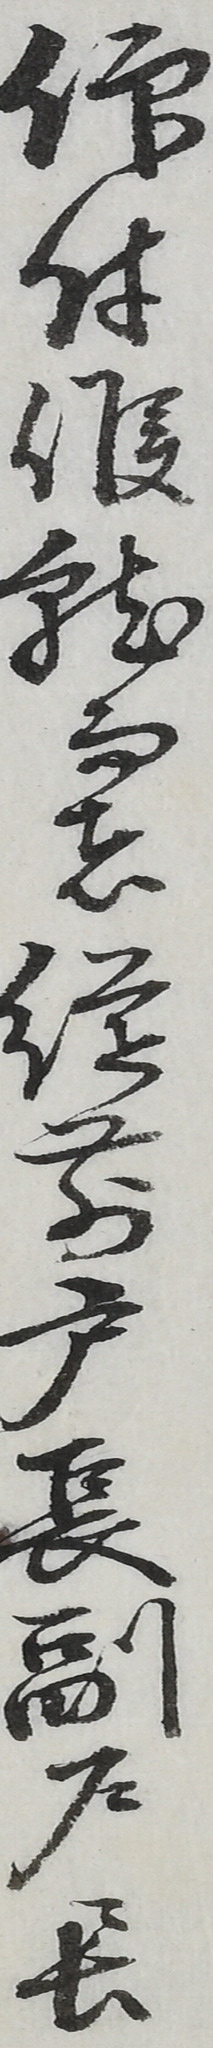仰付候就而は従前戸長副戸長
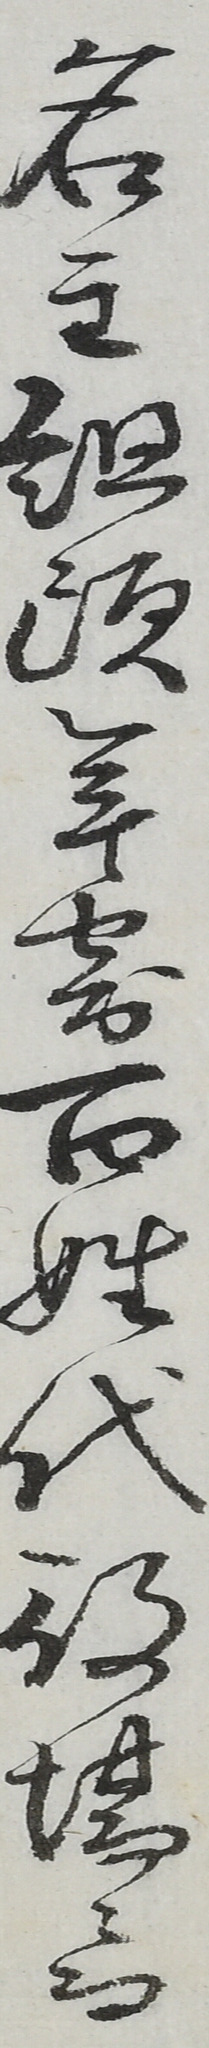名主組頭年寄百姓代役場ニ而
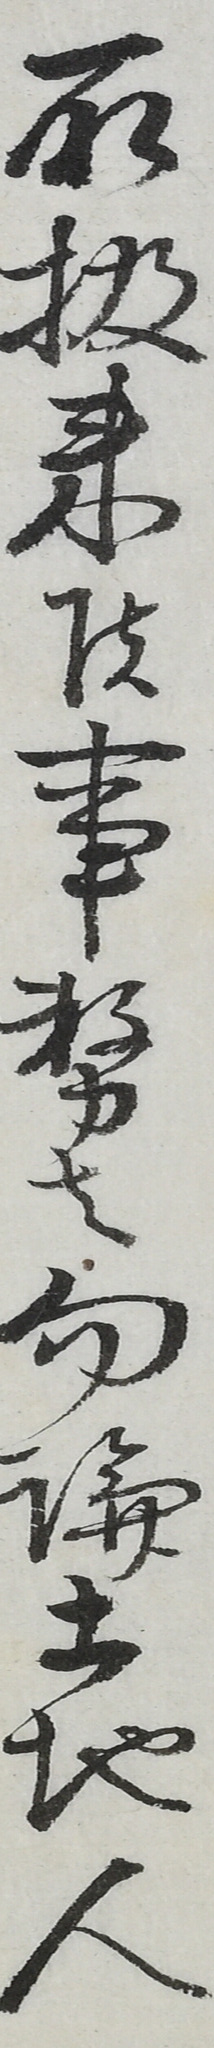取扱来候事務は勿論土地人
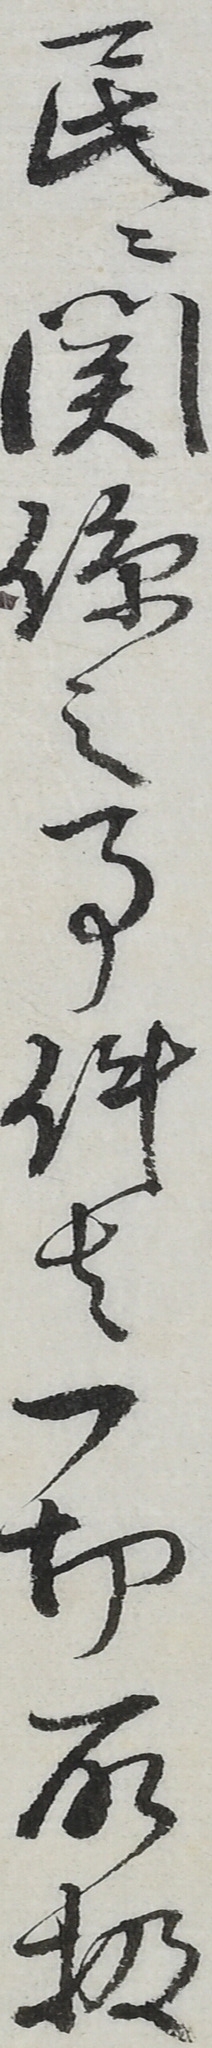民ニ関係之事件は一切取扱

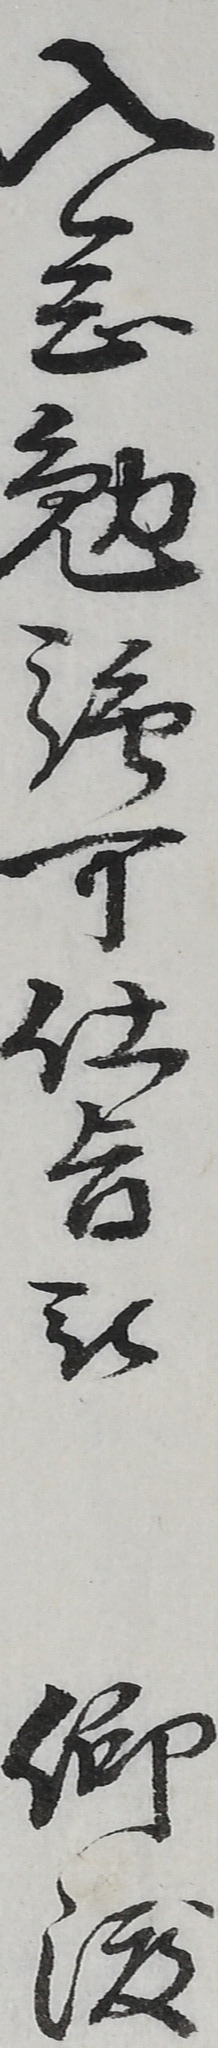入念勉強可仕旨被御渡
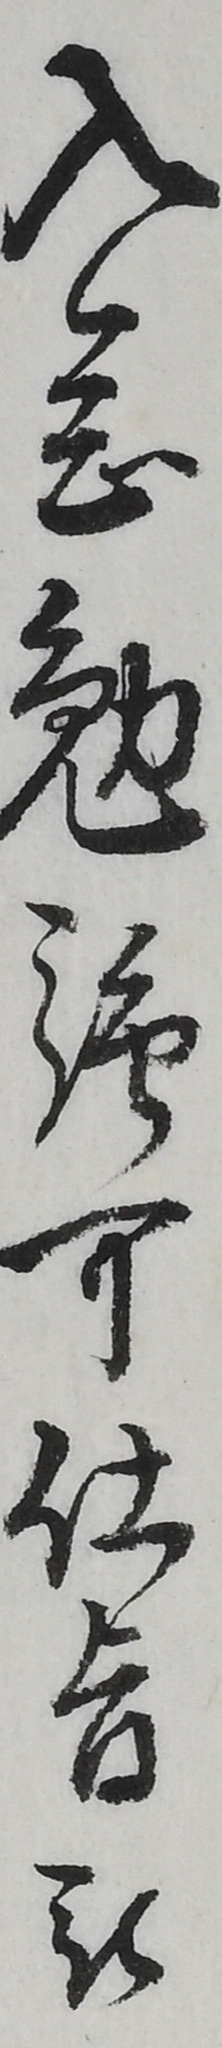入念勉強可仕旨被御渡
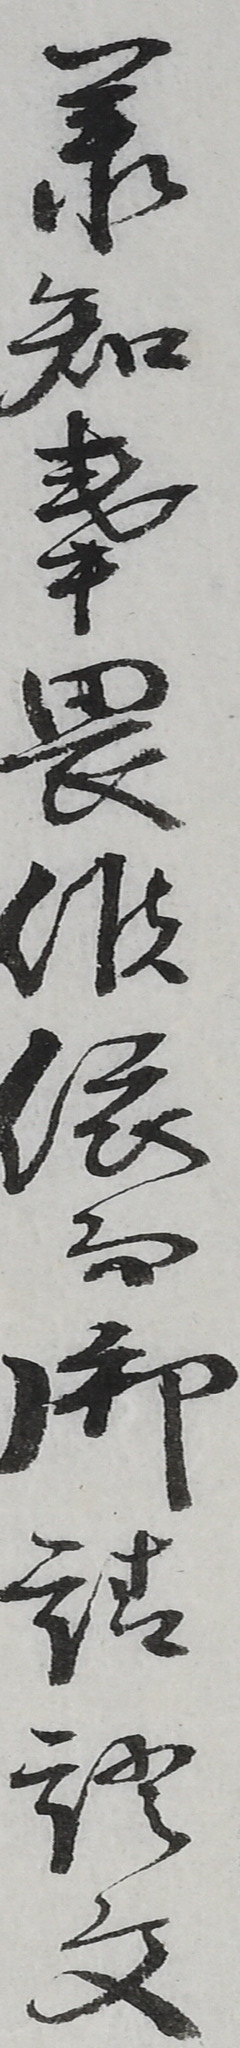承知奉畏候依而御請証文
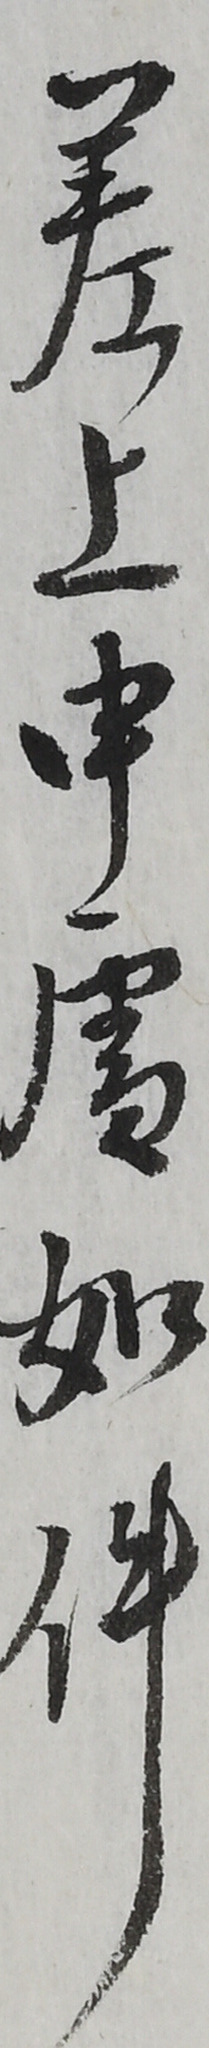差上申処如件
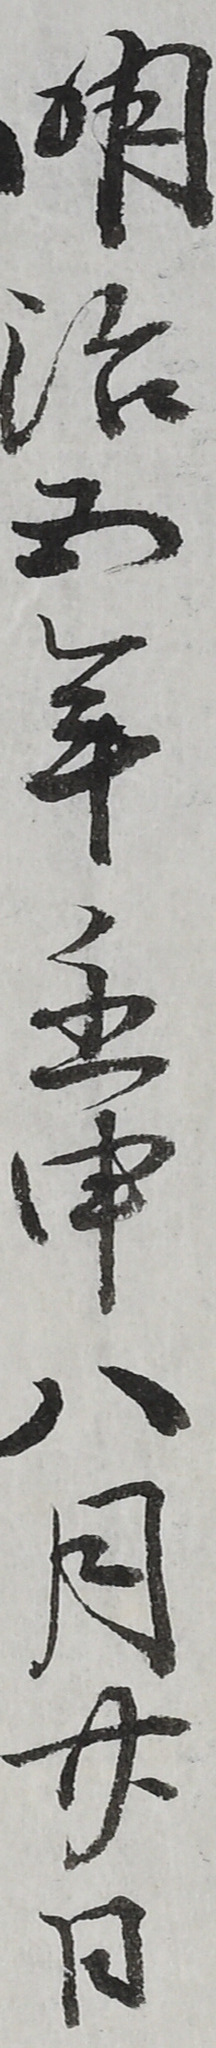明治五年壬申八月廿
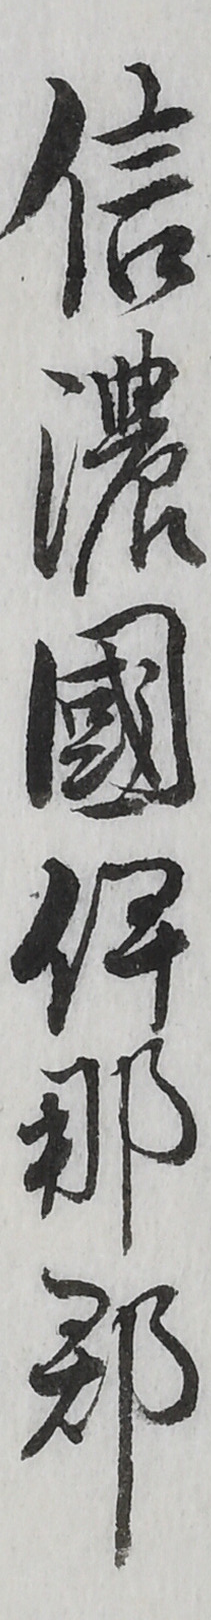信濃国伊那郡
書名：伊那郡毎村戸長副戸長名簿
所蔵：伊那市立高遠町図書館・合同会社AMANE
